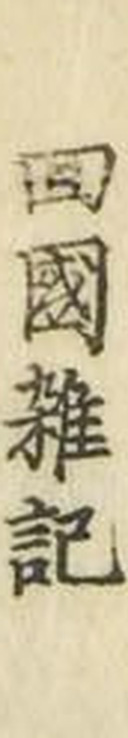四国雑記
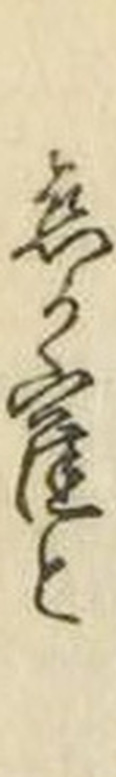恋ゕ窪と
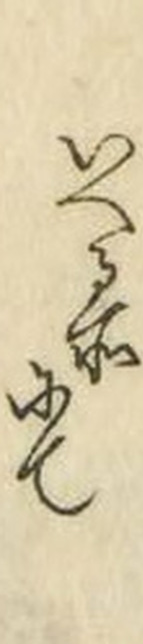いへる所にて
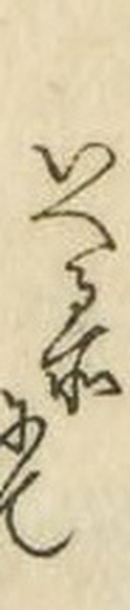いへる所にて
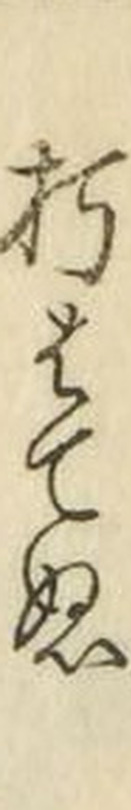朽はてぬ
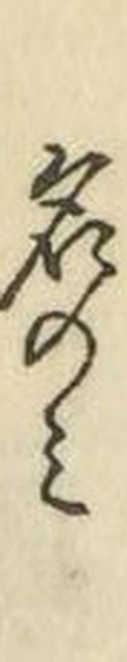名のみ
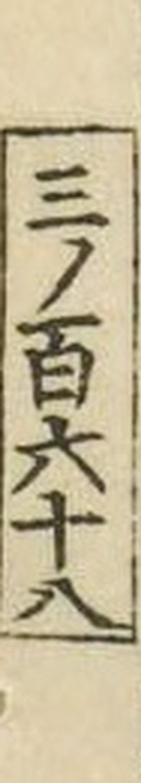三ノ百六十八
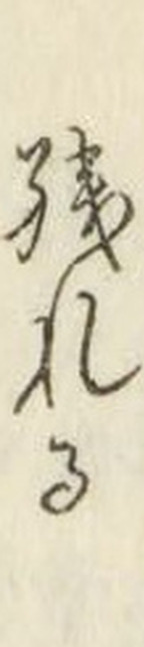残れる
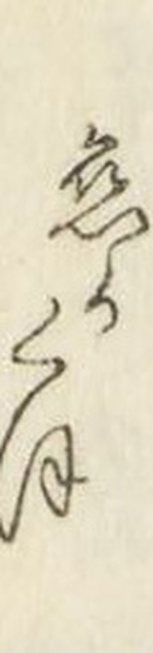恋ゕくほ
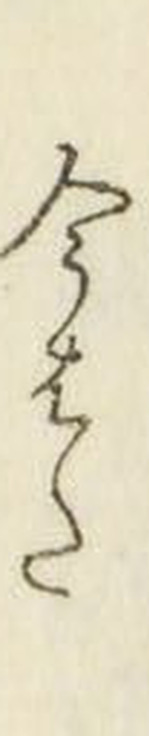今はた
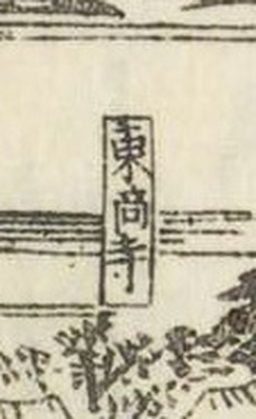東商寺
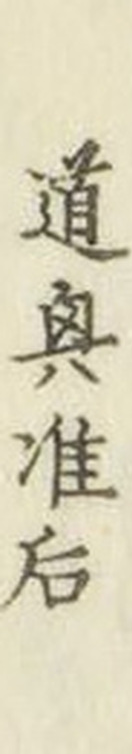道興准后

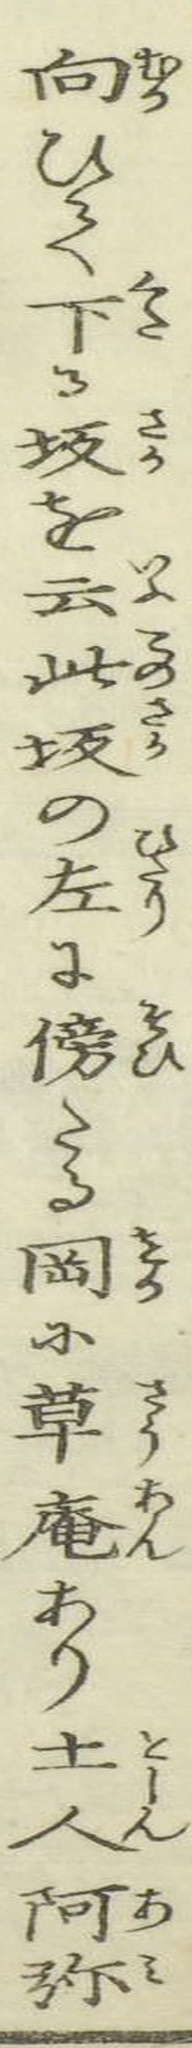向ひて下る坂を云此坂の左に傍たる岡に草庵あり土人阿弥
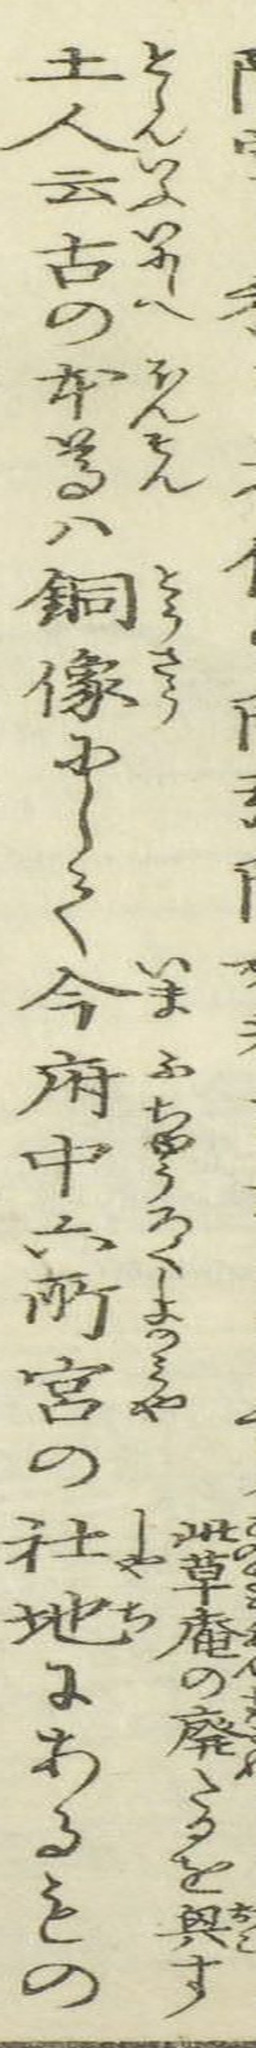土人云古の本尊は銅像にして今府中六所宮の社地にあるもの
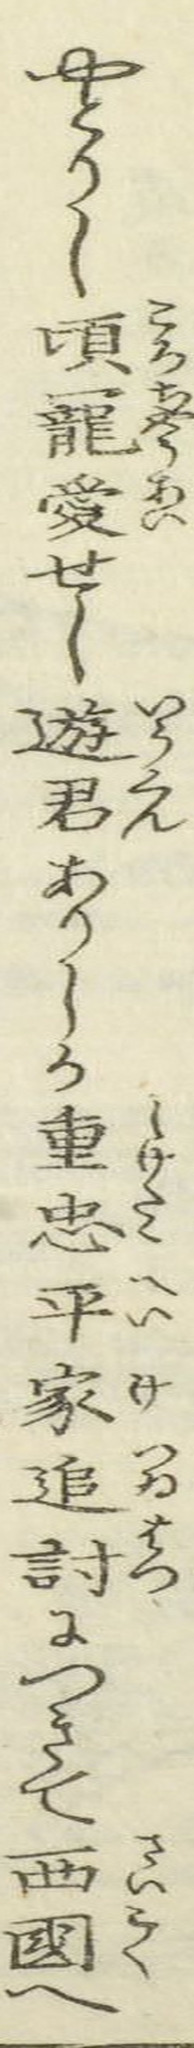やとりし頃寵愛せし遊君ありしか重忠平家追討につきて西国へ
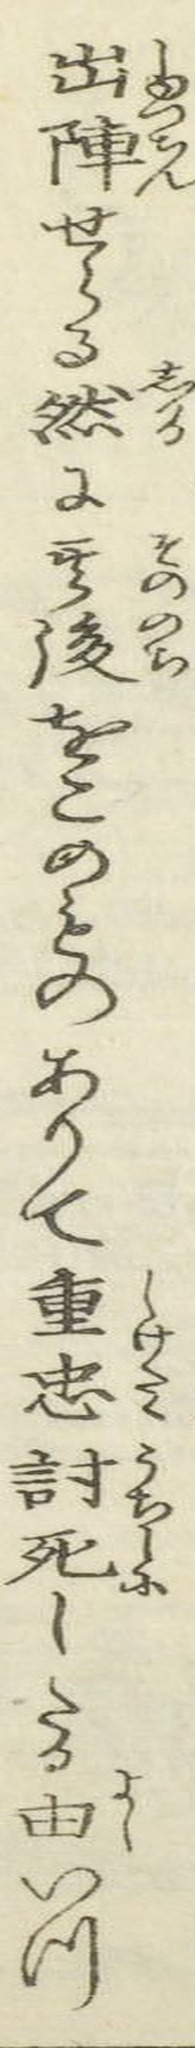出陣せらる然に其後をこのものありて重忠討死したる由いつ
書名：江戸名所図会 20巻 巻之9
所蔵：東京学芸大学教育コンテンツアーカイブ
